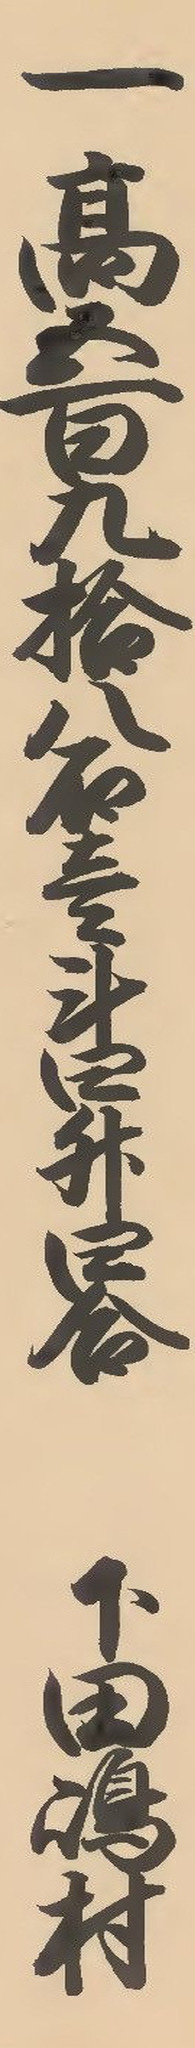一髙五百九拾八石壱斗四升四合下田嶋村
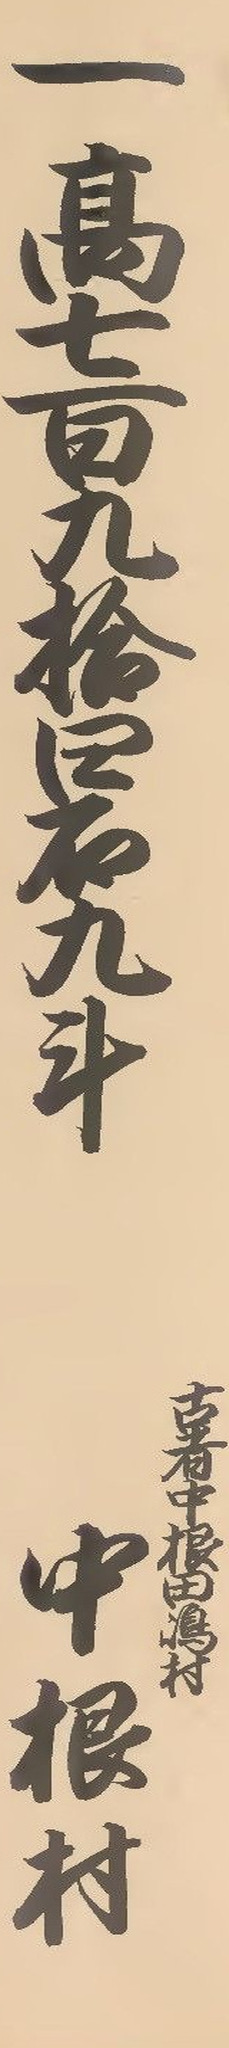一髙七百九拾四石九斗中根村
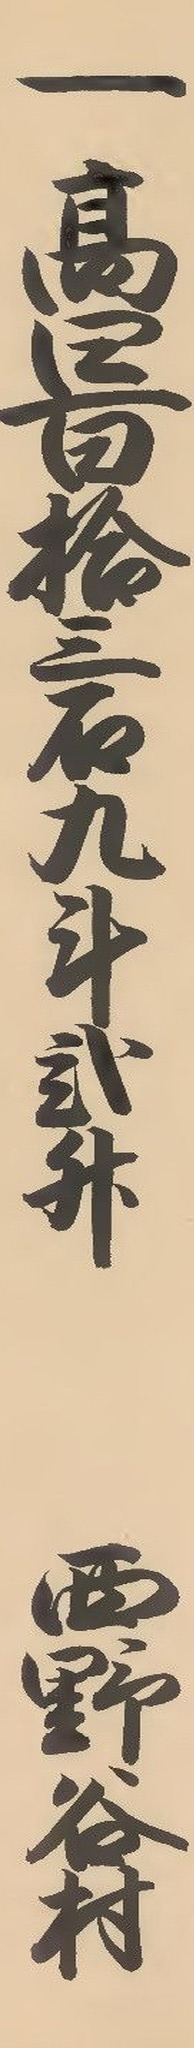一髙四百拾三石九斗弐升西野谷村
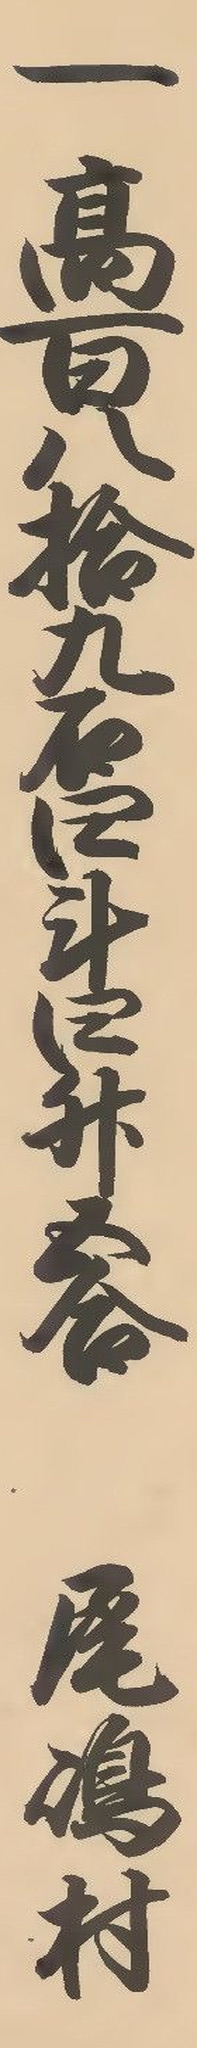一髙百八拾九石四斗四升五合尾嶋村
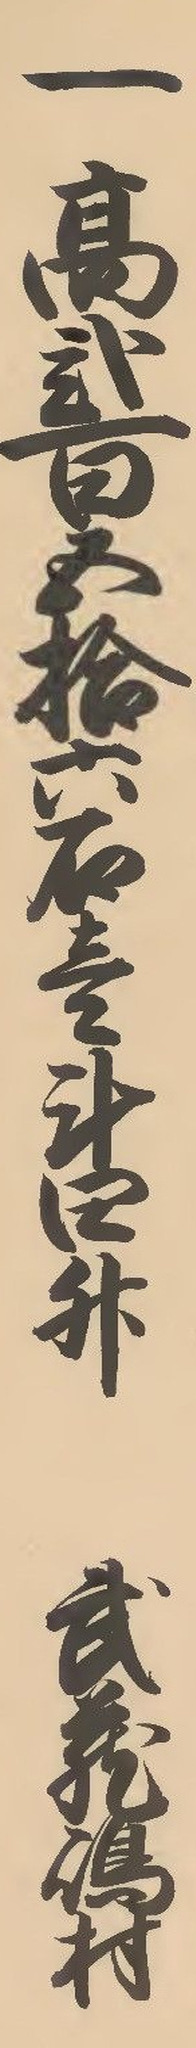一髙弐百五拾六石壱斗四升武藏嶋村

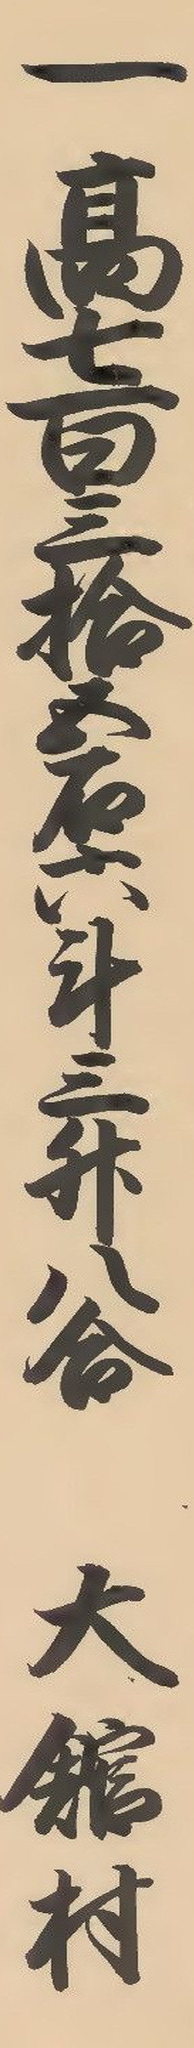一髙七百三拾五石六斗三升八合大舘村
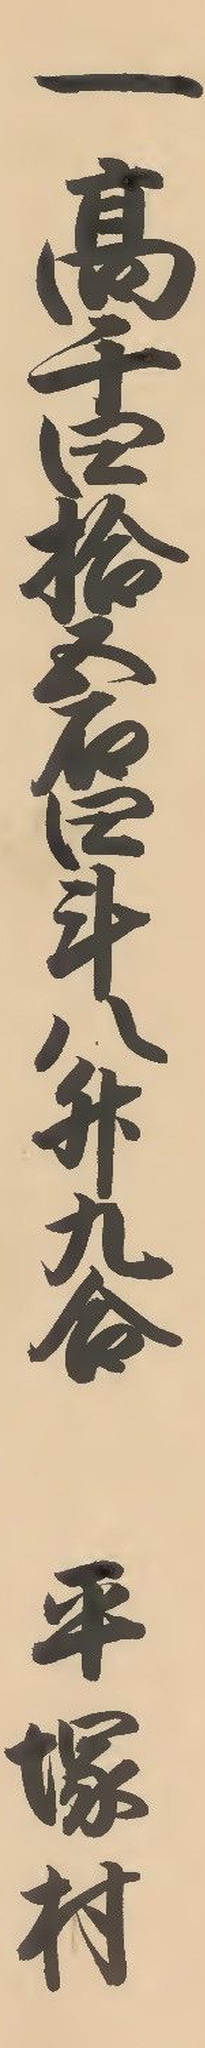一髙千四拾五石四斗八升九合平塚村
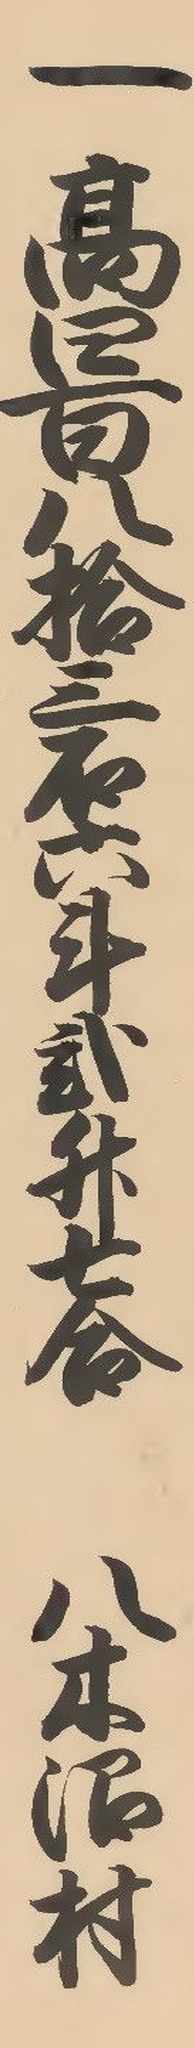一髙四百八拾三石六斗弐升七合八木沼村
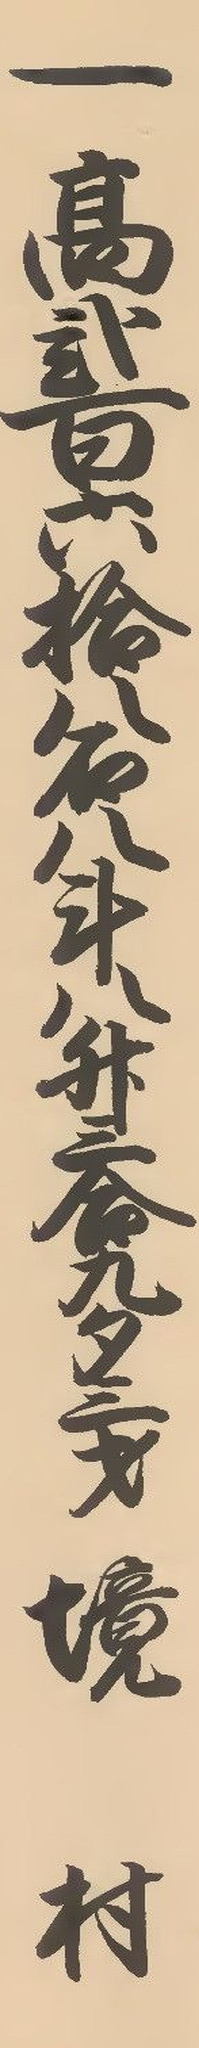一髙弐百六拾八石八斗八升三合九夕三才堺村
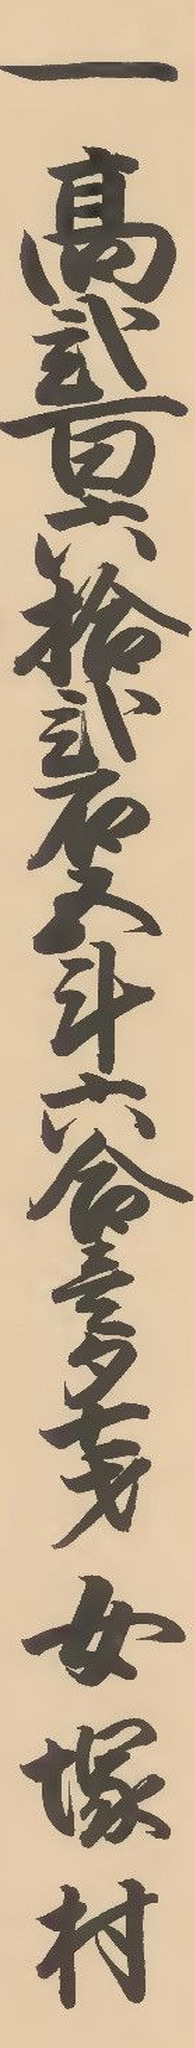一髙弐百六拾弐石五斗六合壱夕七才女塚村
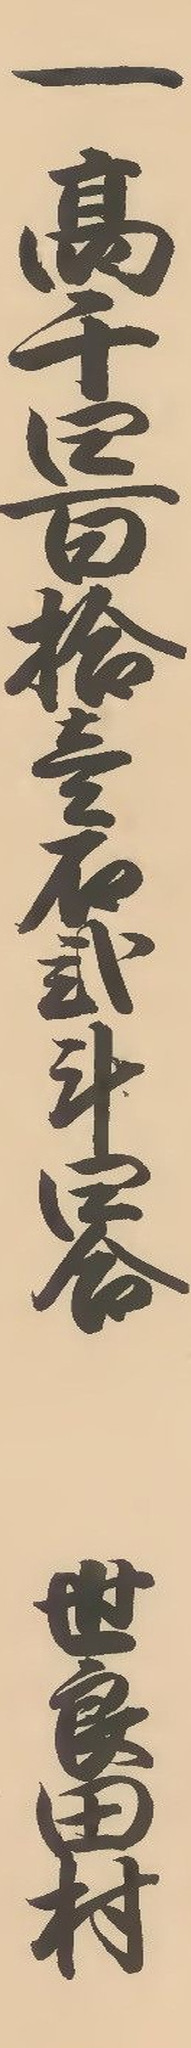一髙千四百拾壱石弐斗四合世良田村

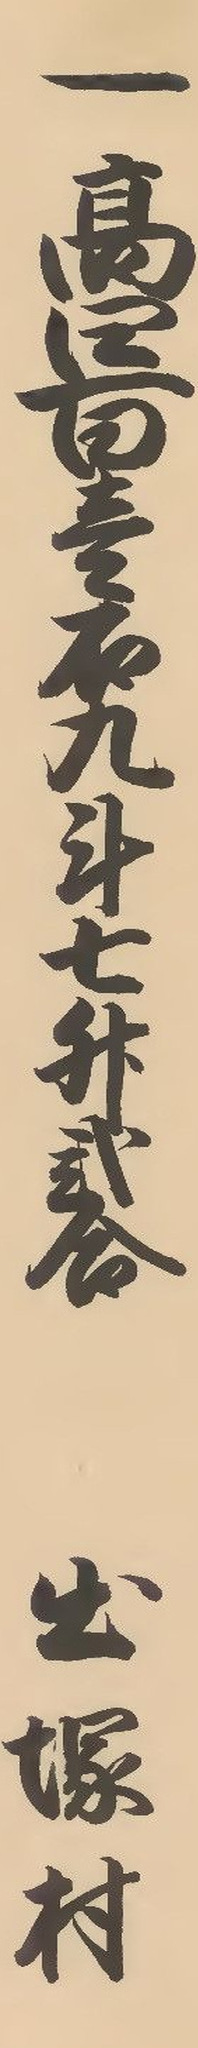一髙四百壱石九斗七升弐合出塚村
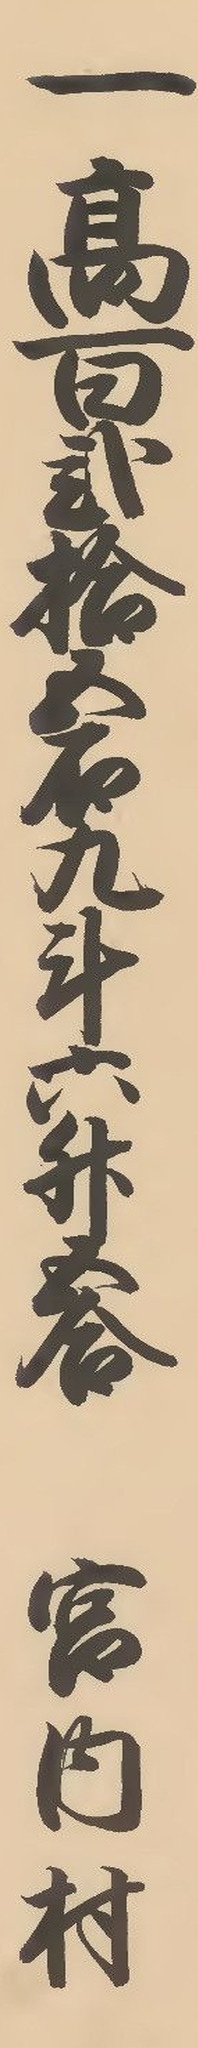一髙百弐拾五石九斗六升五合宮内村
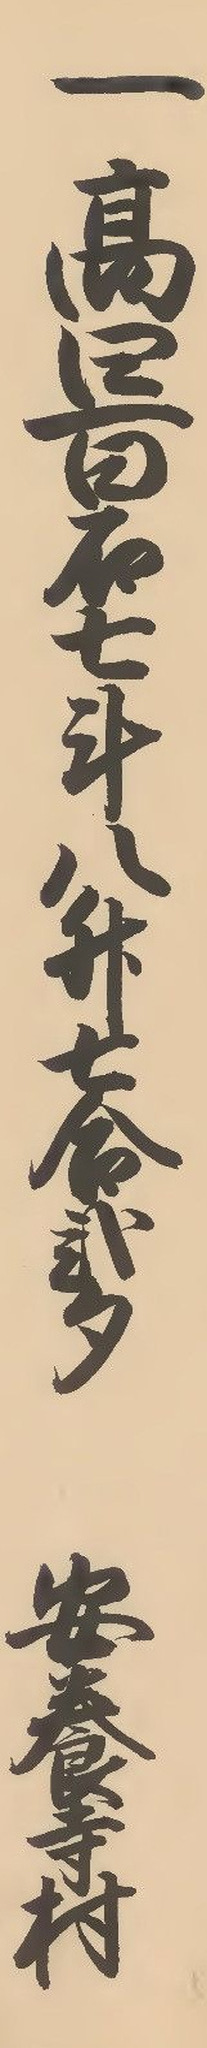一髙四百石七斗八升七合弐夕安養寺村
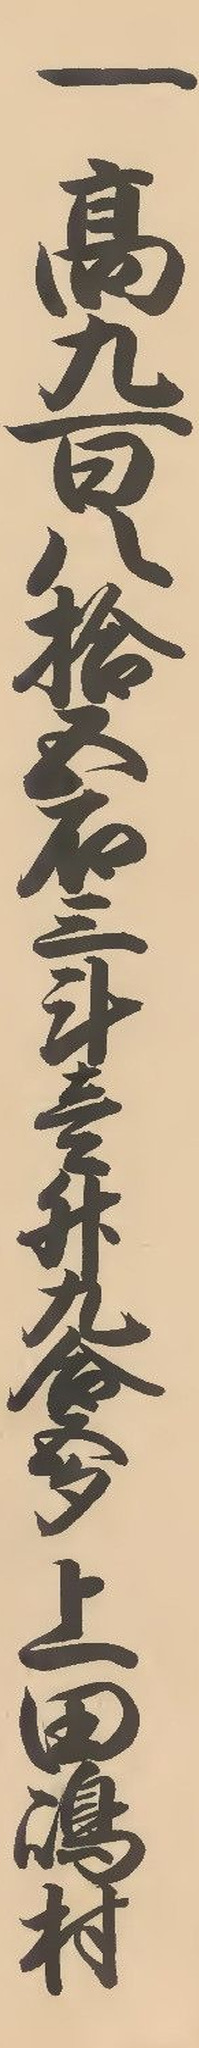一髙九百八拾五石三斗壱升九合五夕上田嶋村
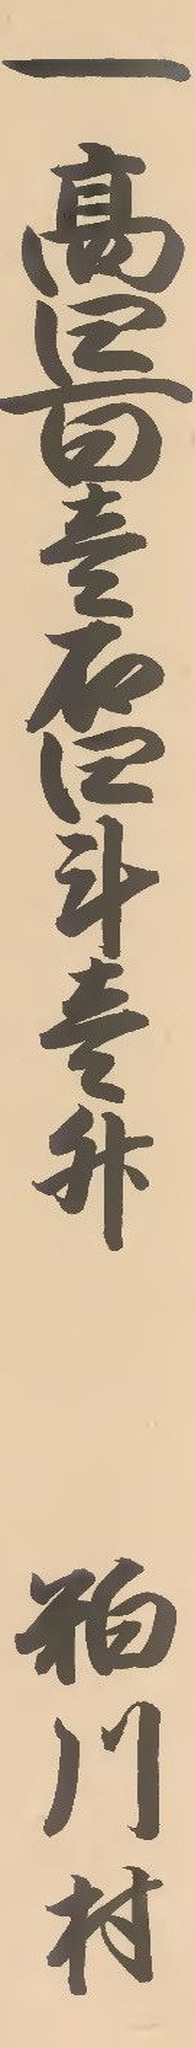一髙四百壱石四斗壱升粕川村
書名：上野国郷帳
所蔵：国立公文書館 National Archives of Japan
